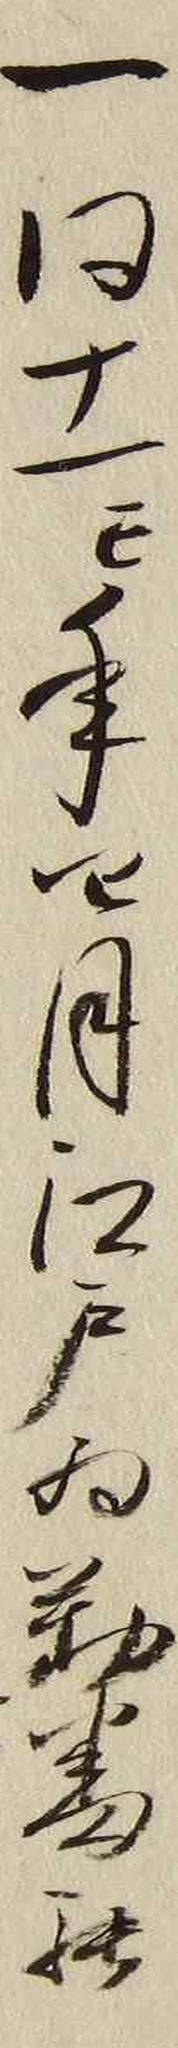一同十一巳年四月江戸為勤番罷
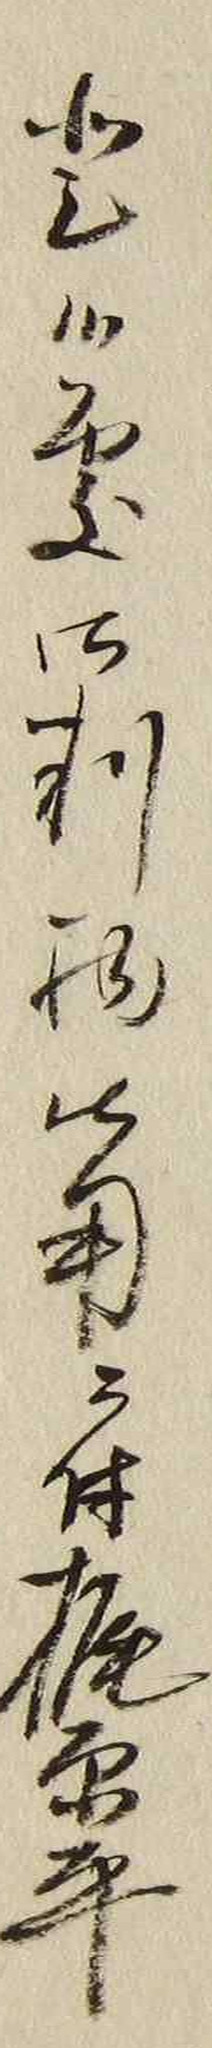登候処御判物御用ニ付梶原平

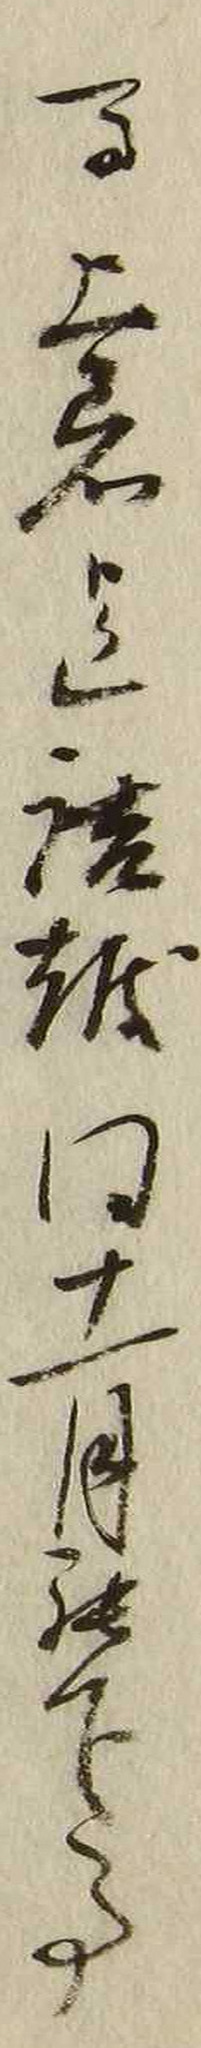馬上着迄詰越同十一月罷下事
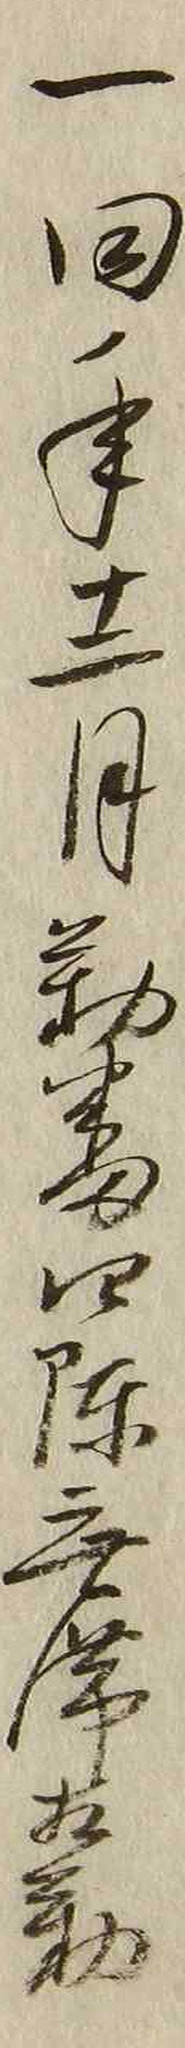一同年十二月勤番四陣無滞相勤
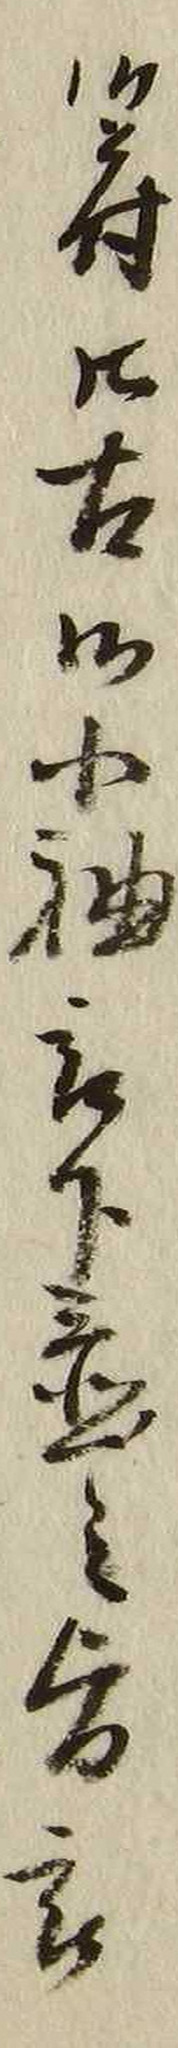候ニ付御古御小袖被下置之旨被
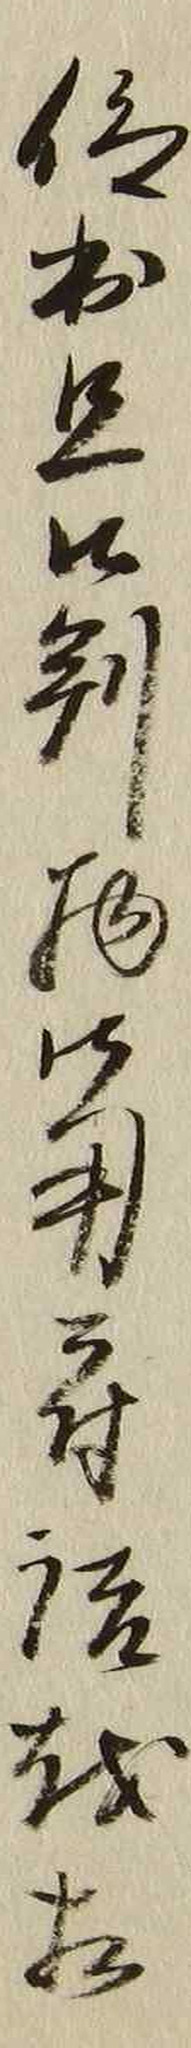仰出且御判物御用ニ付詰越相
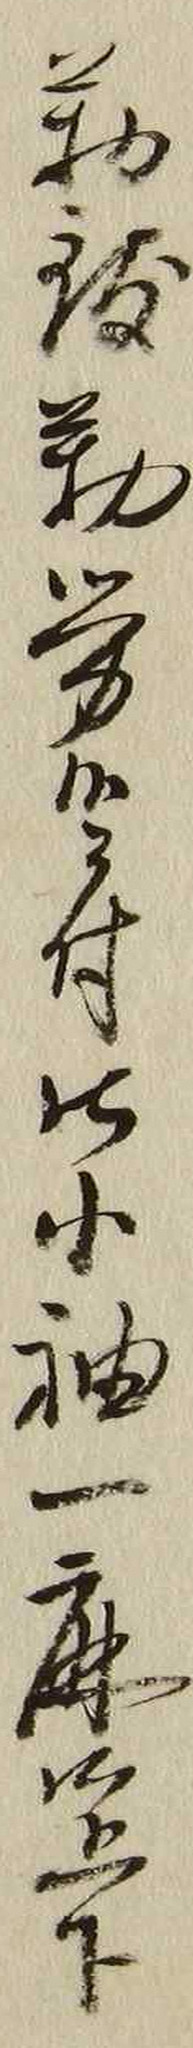勤致勤労候ニ付御小袖一麻御上下
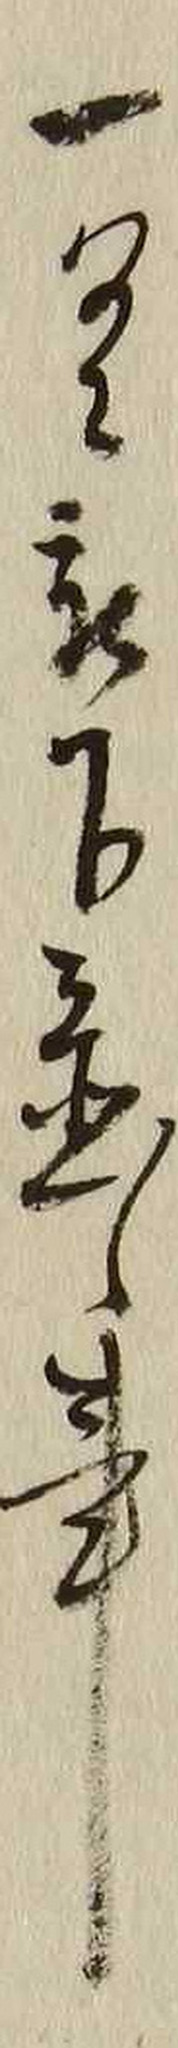一具被下置候事
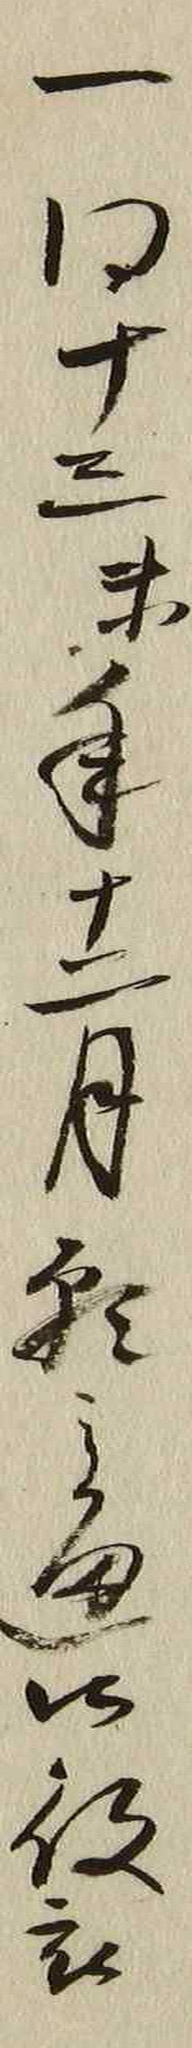一同十三未年十二月願之通御役被
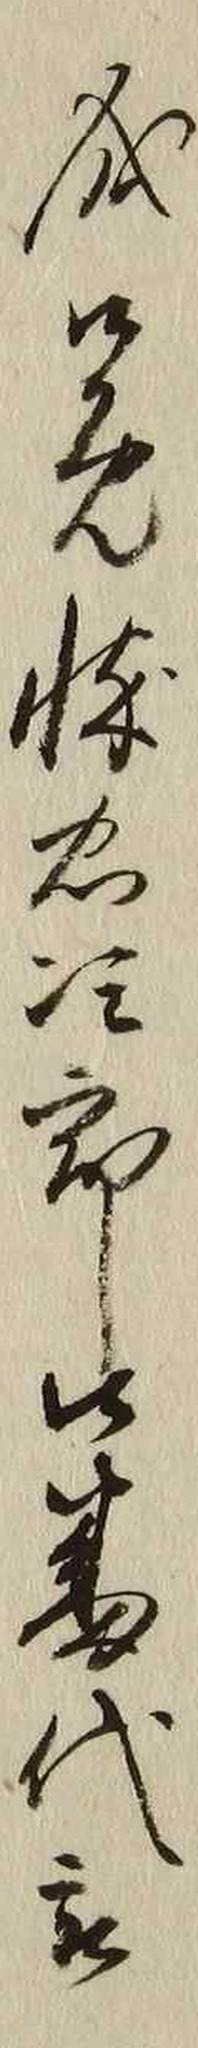成御免忰忠次郎御番代被
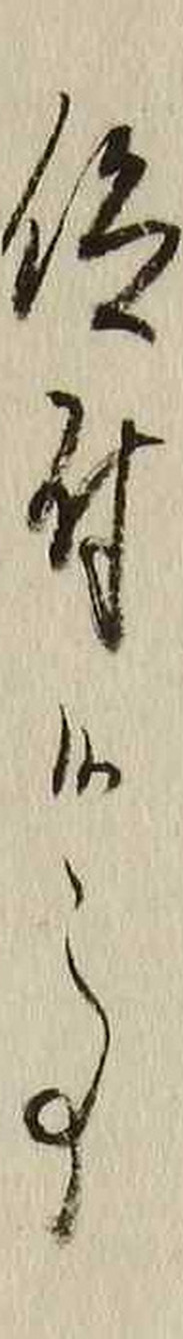仰付候事
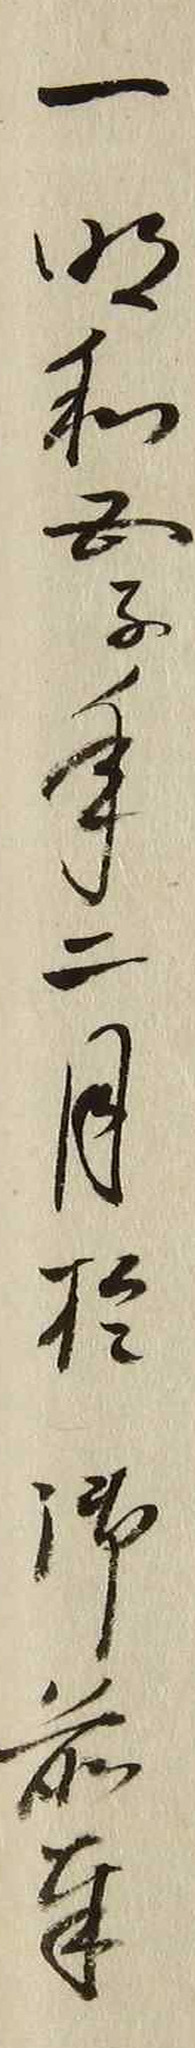一明和五子年二月於御前奉
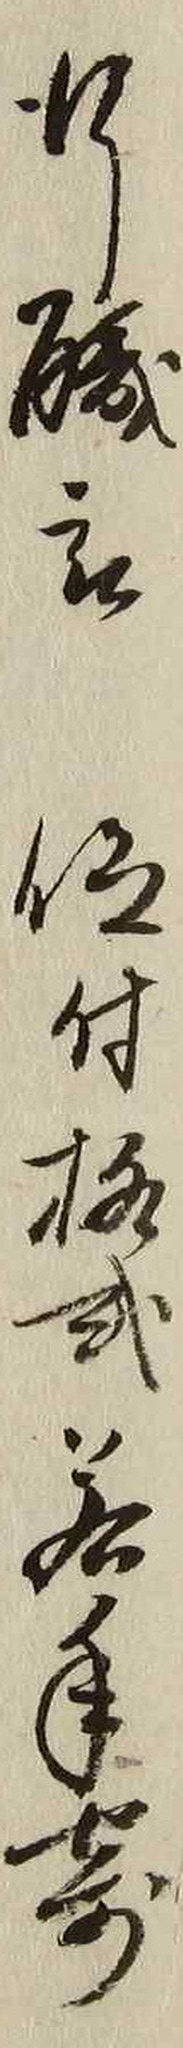行職被仰付格式若年寄
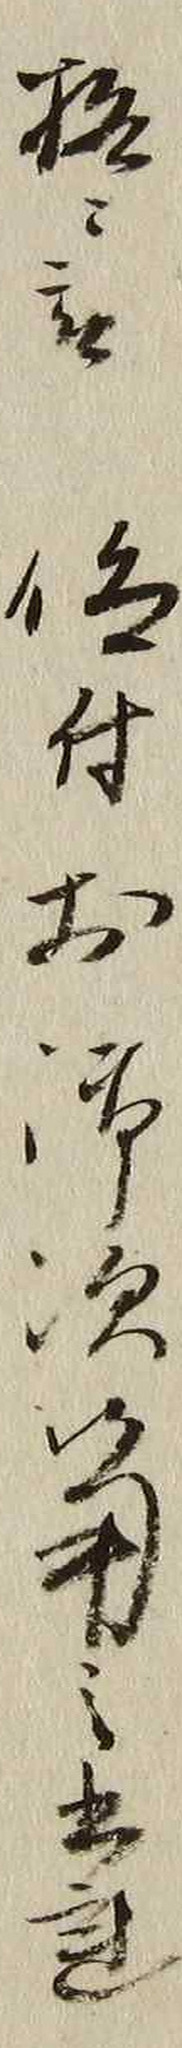格ニ被仰付於御次御用之書連
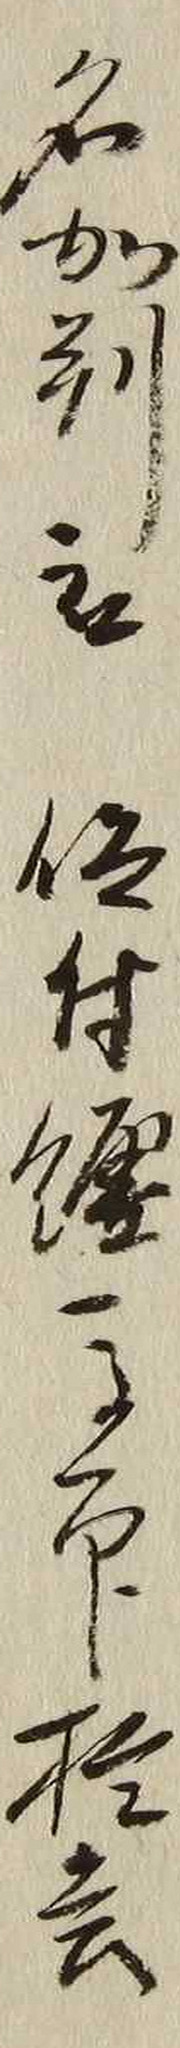名加判被仰付纏馬印於会
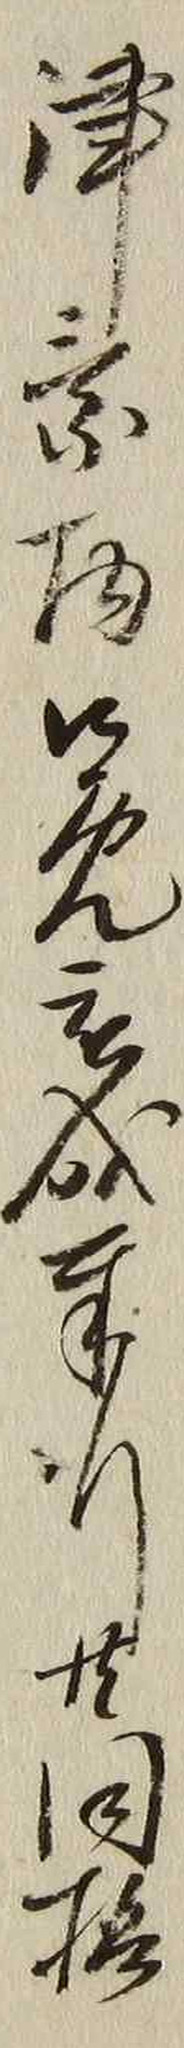津乗物御免被成奉行共同様
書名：諸士系譜　巻之351　す之部1
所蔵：会津若松市立会津図書館
